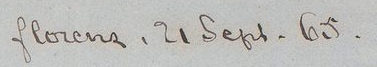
Florenz, 21 Sept. 65.
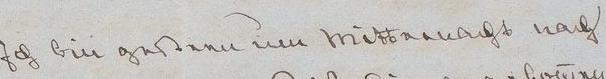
Ich bin gestern um Mitternacht nach
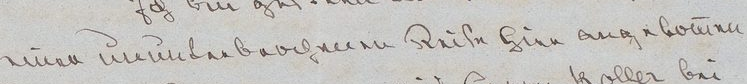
einer ununterbrochenen Reise hier angekommen
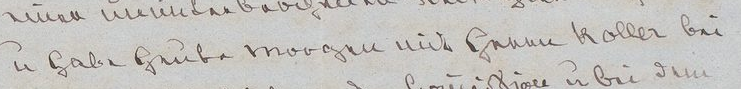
u habe heute morgen mit Herrn Koller bei
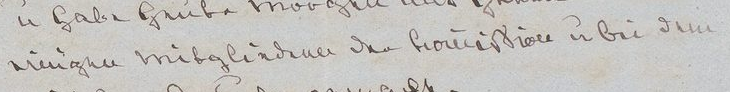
einigen Mitgliedern der Kommission u bei dem
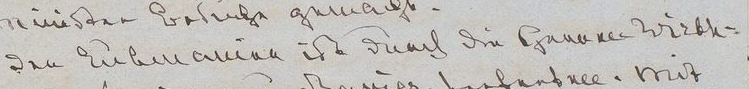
Der Lukmanier ist durch die Herren Wirth-
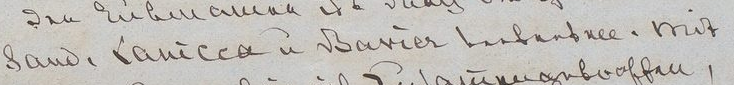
Sand, Lanicca u Bavier vertreten. Mit
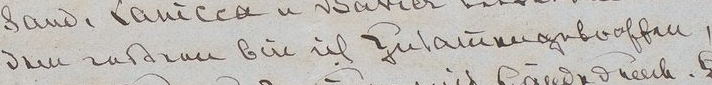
dem erstern bin ich zusammengetroffen,
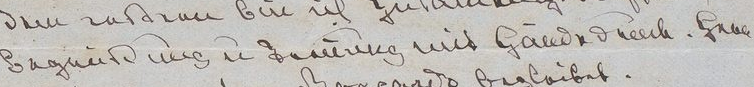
Begrüßung u Trennung mit Händedruck. Herr
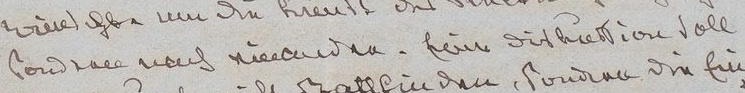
sondern nach einander. Eine Diskussion soll
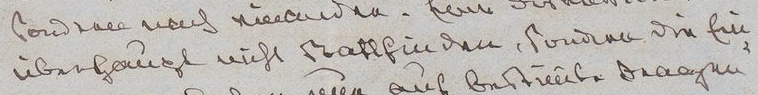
überhaupt nicht stattfinden, sondern die Ein-
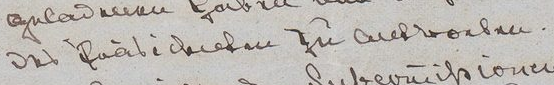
des Präsidenten zu antworten.
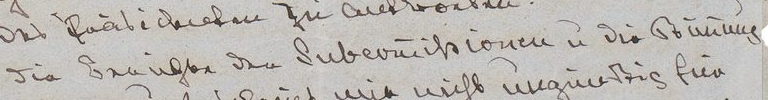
Die Berichte der Subcommissionen u die Stimmung
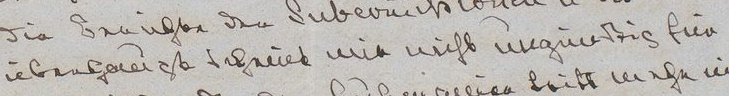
überhaupt scheint mir nicht ungünstig für
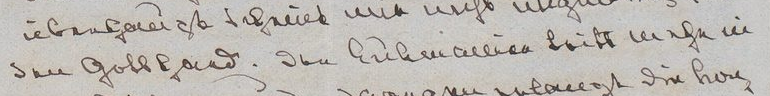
den Gotthard. Der Lukmanier tritt mehr in
